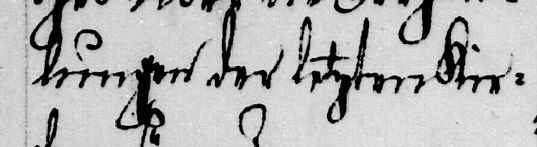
tungen des Kirchenrathes,
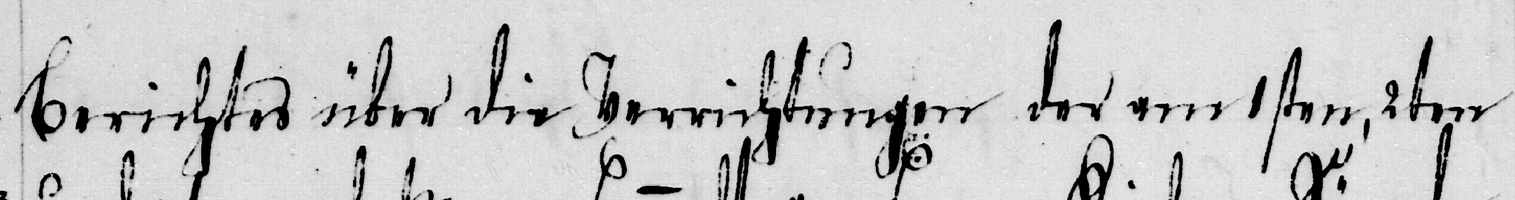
Berichtes über die Verrichtungen der am 1sten, 2ten
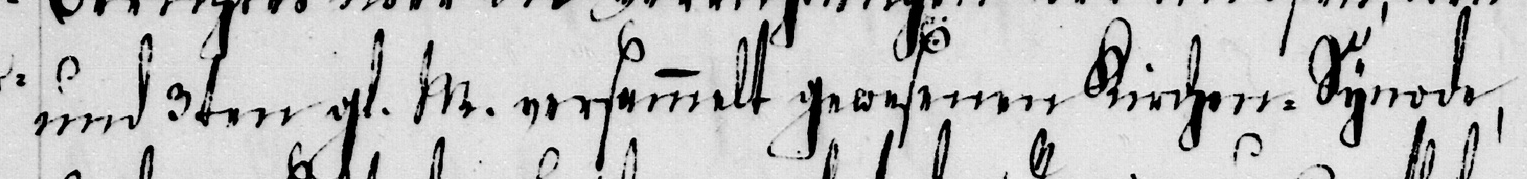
und 3ten gl. M. versammelt gewesenen Kirchen-Synode,
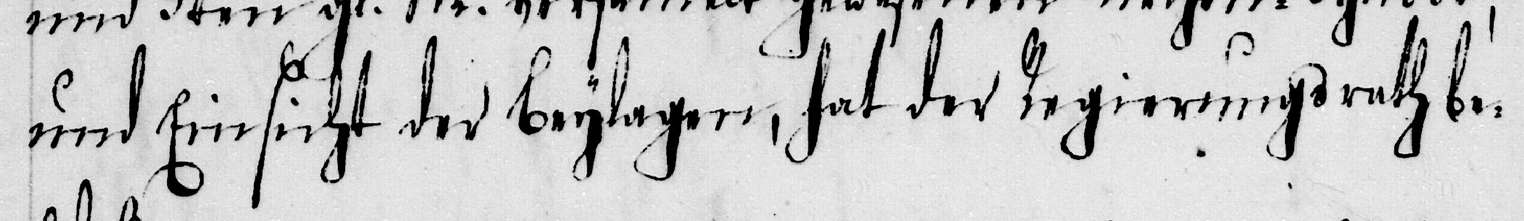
und Einsicht der Beylagen, hat der Regierungsrath be¬
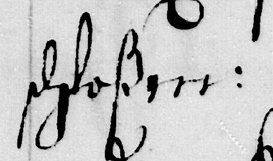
schloßen:
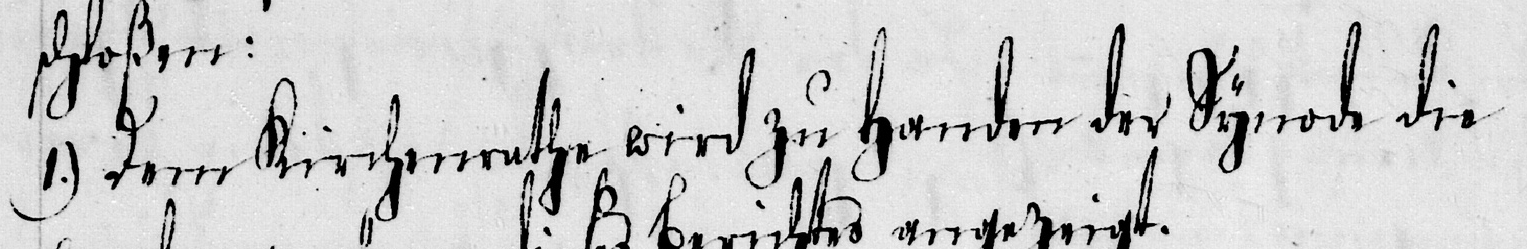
1.) Dem Kirchenrathe wird zu Handen der Synode die
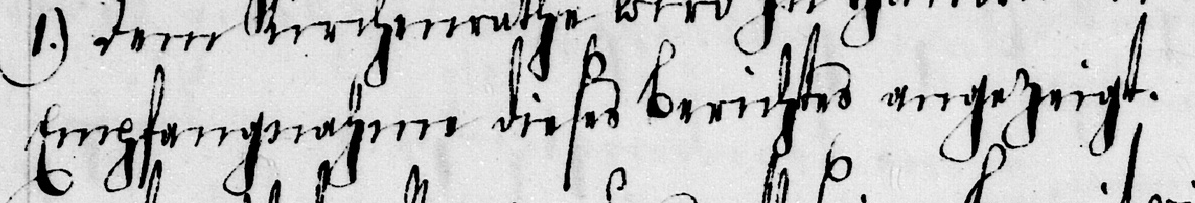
Empfangnahme dieses Berichtes angezeigt.
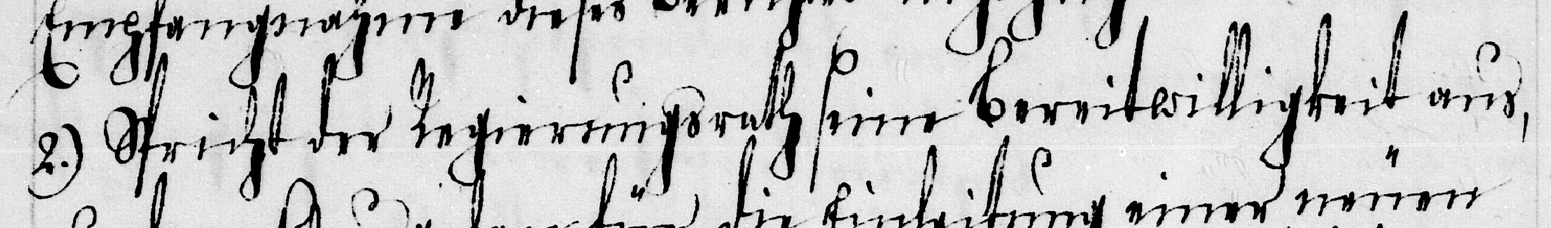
2.) Spricht der Regierungsrath seine Bereitwilligkeit aus,
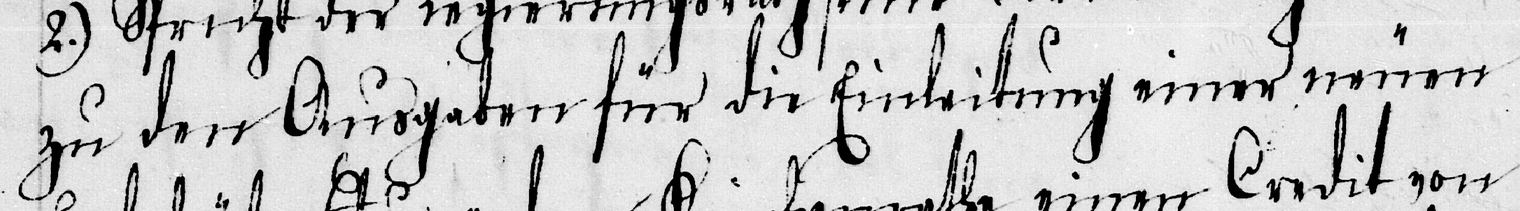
zu den Ausgaben für die Einleitung einer neuen
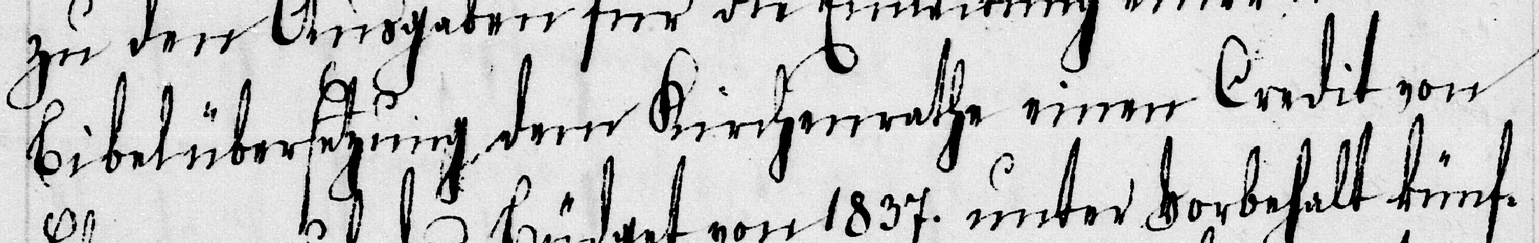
Bibelübersetzung dem Kirchenrathe einen Credit von
